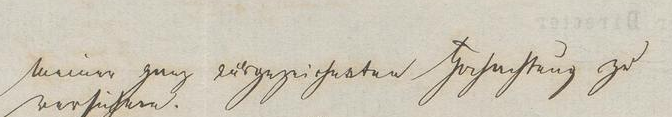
meiner ganz ausgezeichnetsten Hochachtung zu
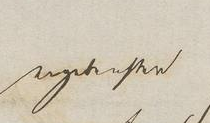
ergebenster
